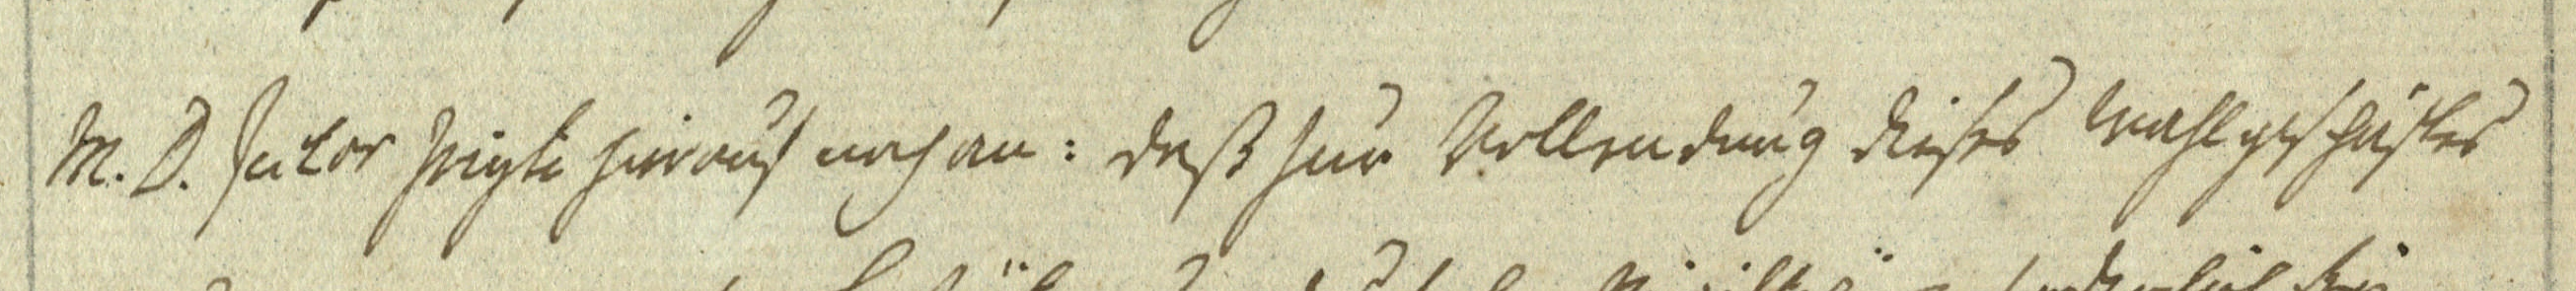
M. D. Rector zeigte hierauf noch an: daß zur Vollendung dieses Wahlgeschäftes
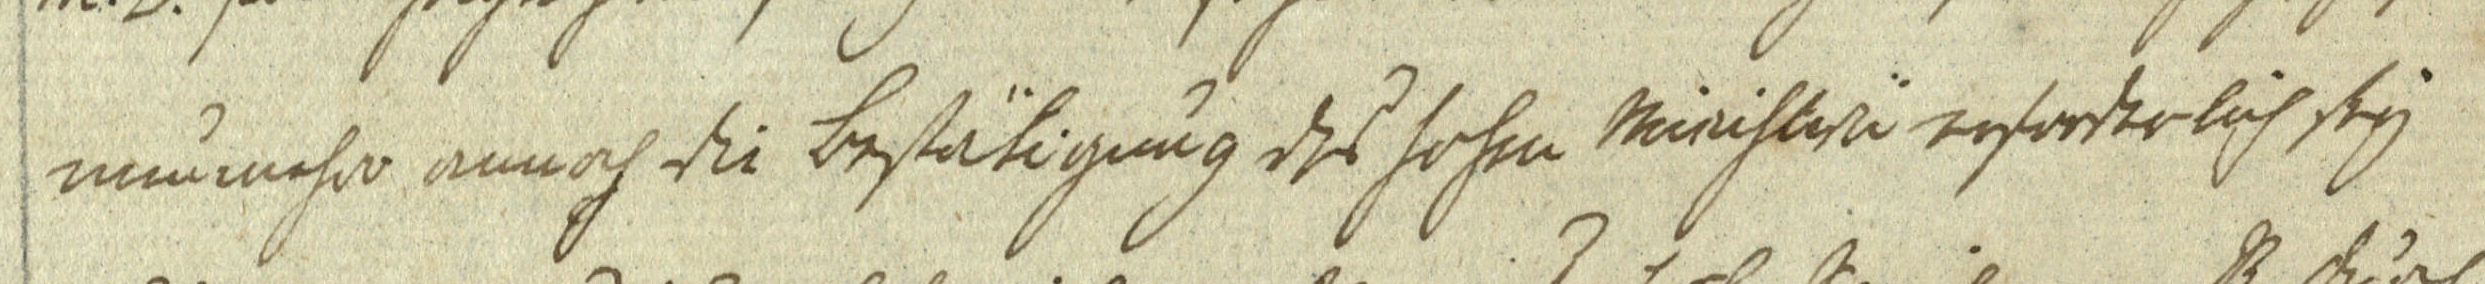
nunmehro annoch die Bestätigung des hohen Ministerii erforderlich seÿ
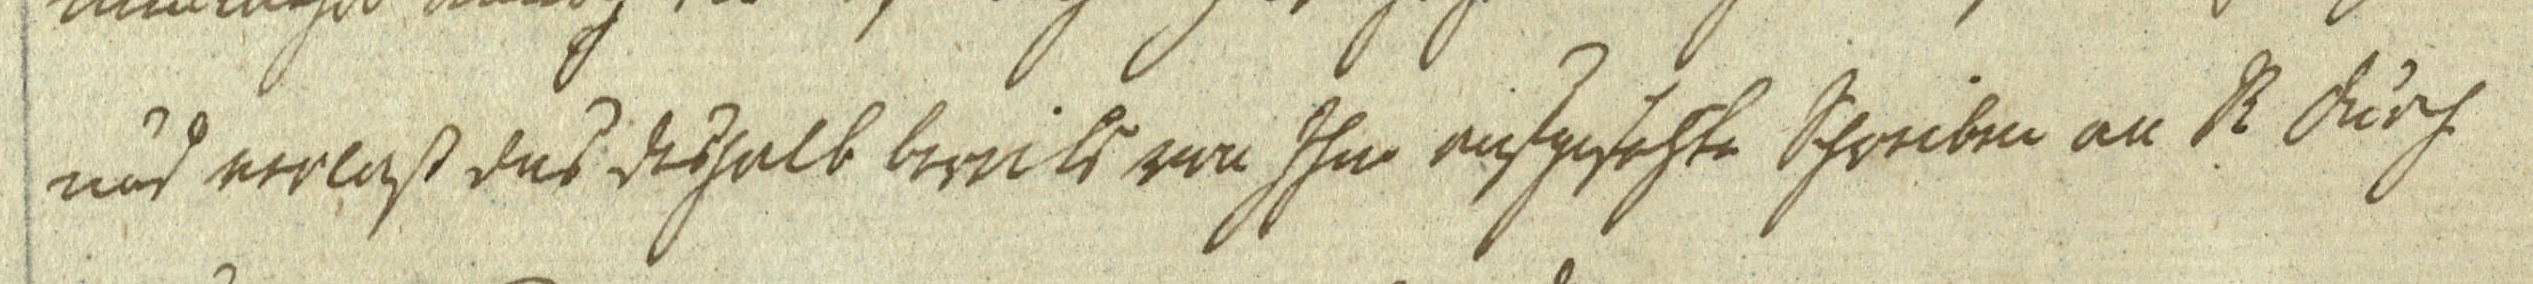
und verlaß das deshalb bereits von Ihm aufgesetzte Schreiben an Sr Durch¬
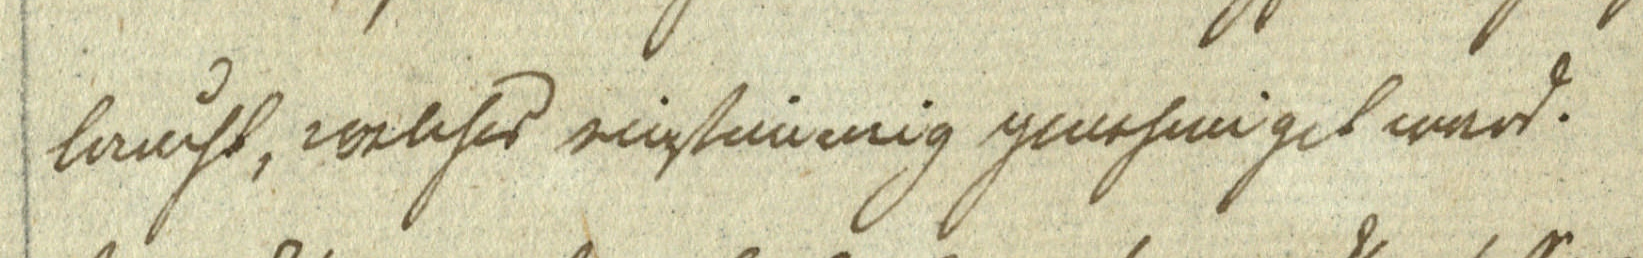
laucht, welches einstimmig genehmiget ward.
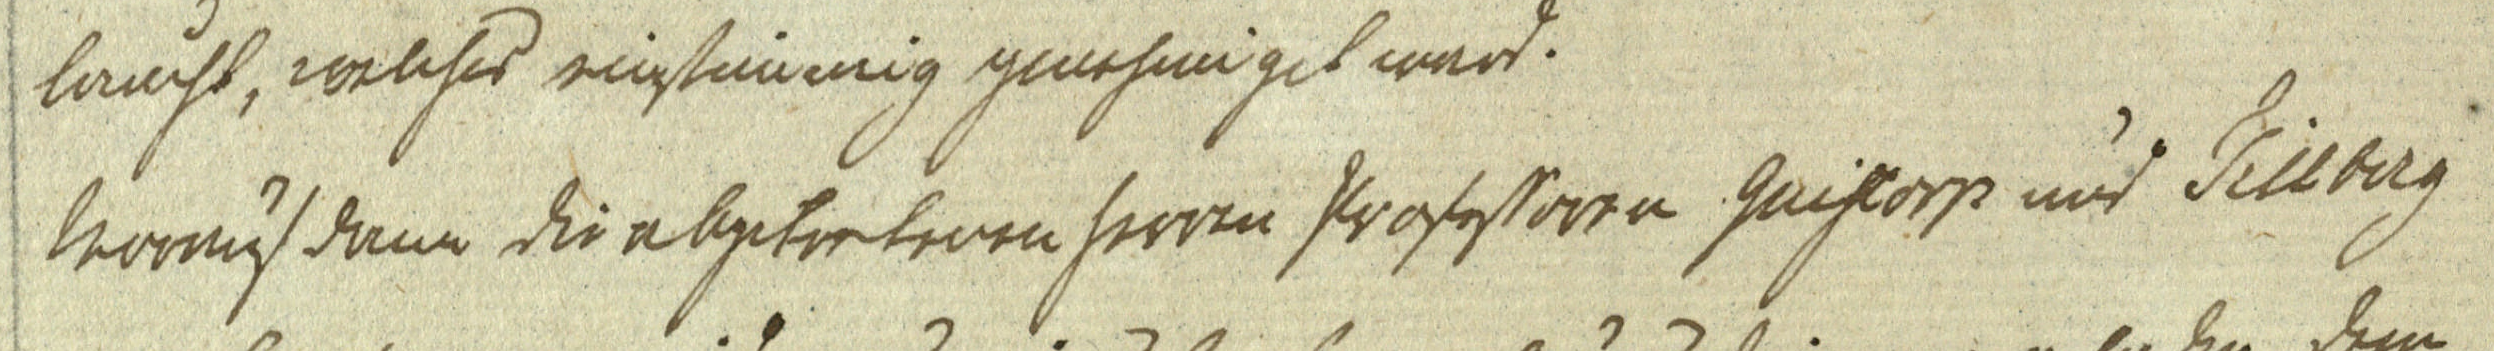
Worauf dann die abgetretenen Herren Professoren Quistorp und Tillberg
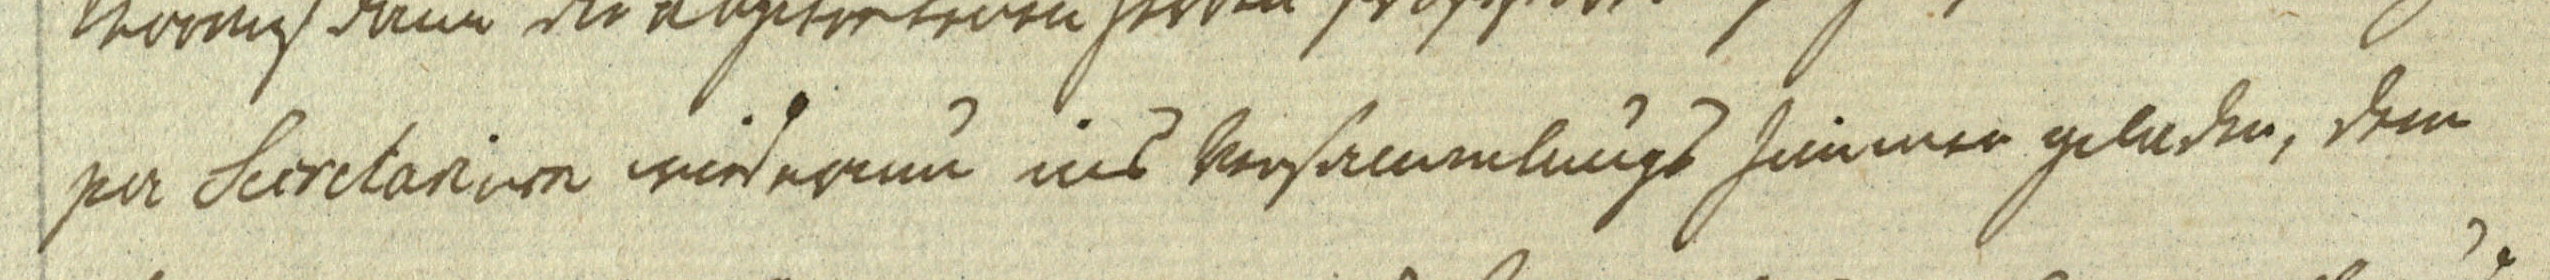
per Secretarium wiederum ins Versammlungs Zimmer geladen, dem
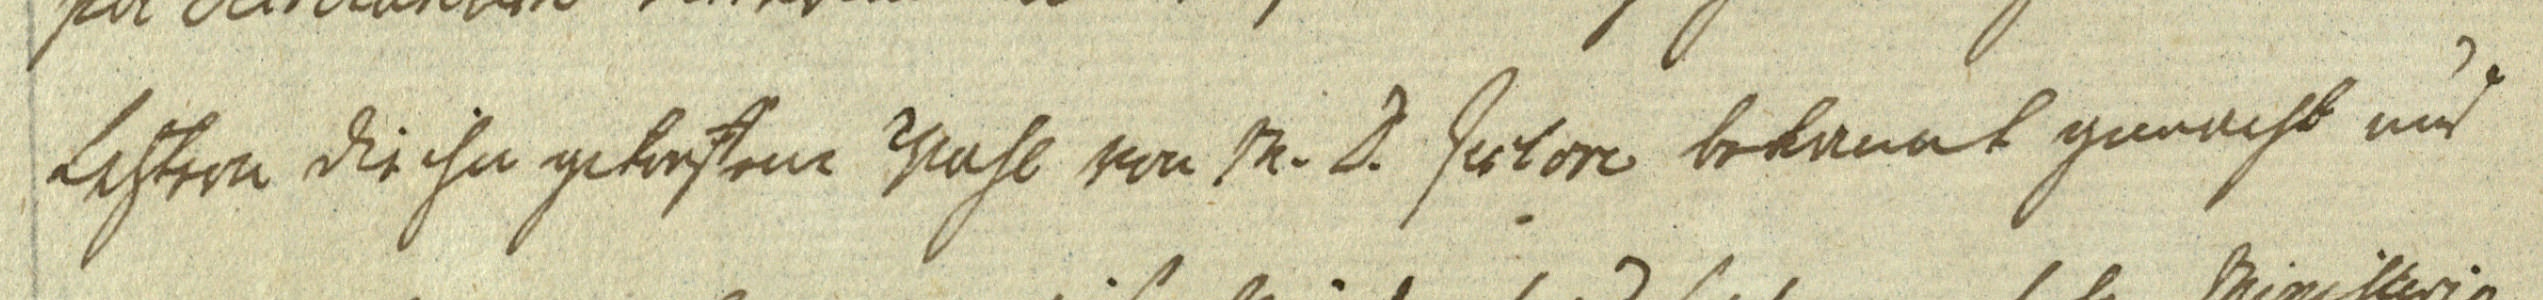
Letztern die ihn getroffene Wahl von M. D. Rectore bekannt gemacht und
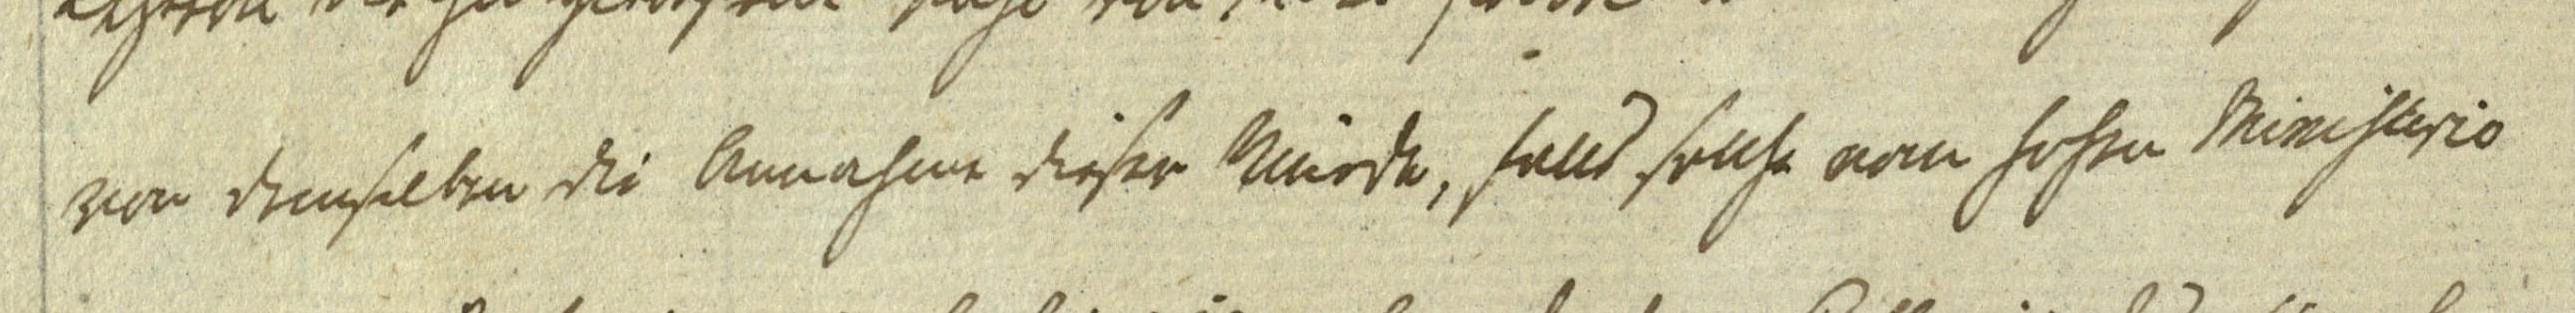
von demselben die Annahme dieser Würde, falls solche vom hohen Ministerio
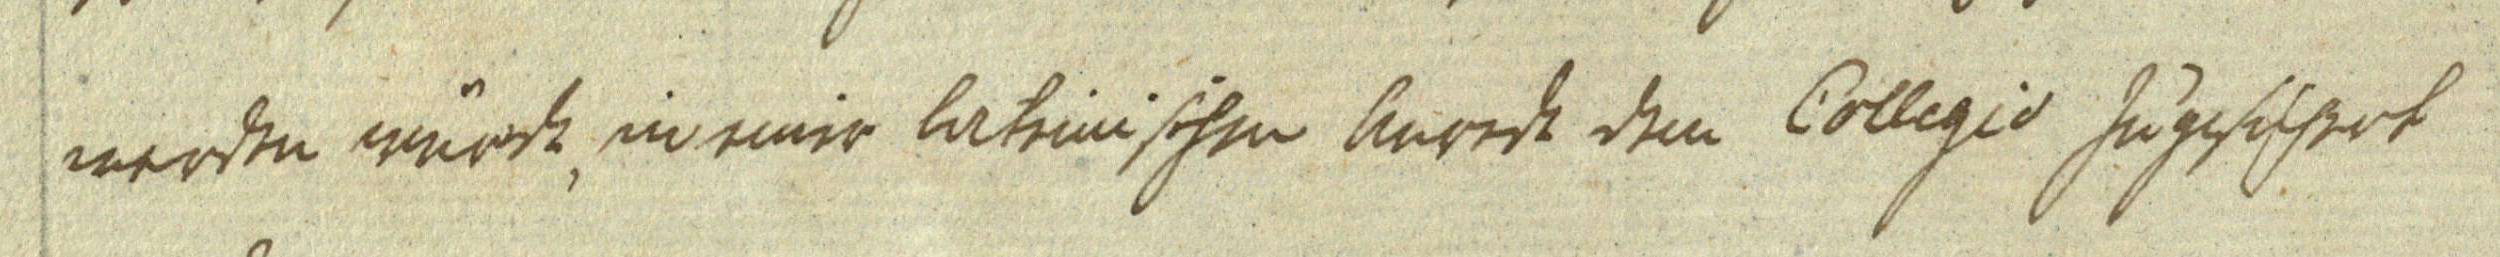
werden würde, in einer lateinischen Anrede dem Collegio zugesichert
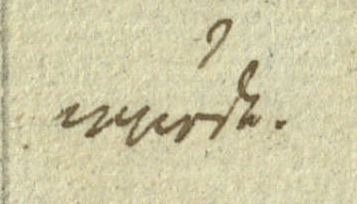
wurde.
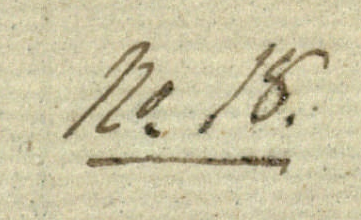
No 18.
